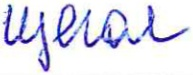щегол
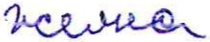желна
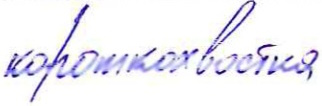короткохвостка
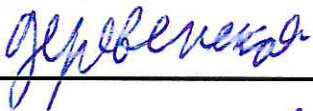деревенская
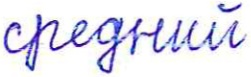средний
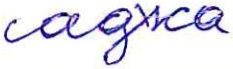саджа
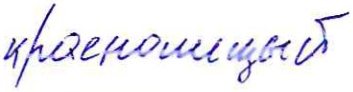краснолицый
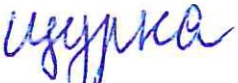щурка
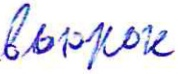вьюрок
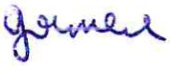дятел
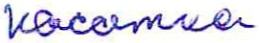касатка
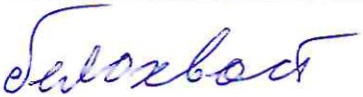белохвост
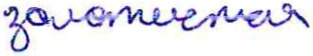золотистая
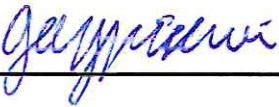даурский
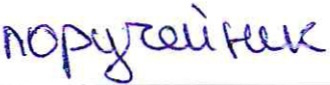поручейник
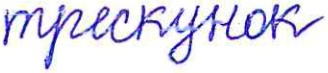трескунок
